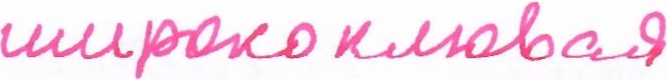ширококлювая
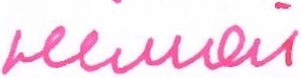немой
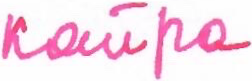кайра
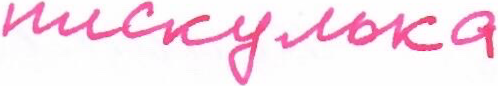пискулька
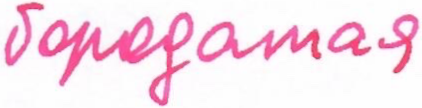бородатая
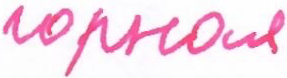горная
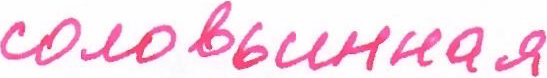соловьинная
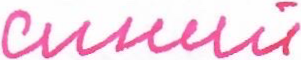синий
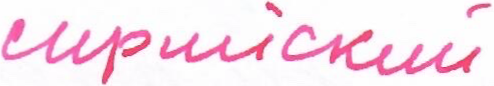сирийский
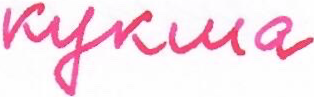кукша
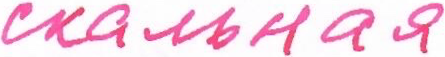скальная
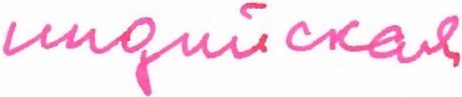индийская
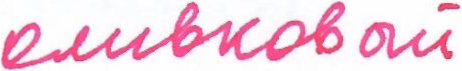оливковый
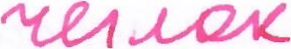чеглок
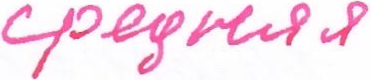средняя
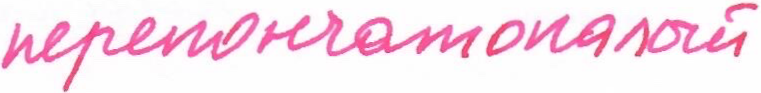перепончатопалый
